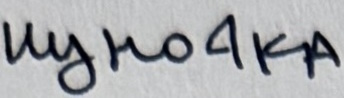пуночка
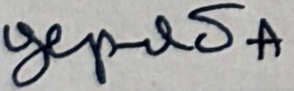деряба
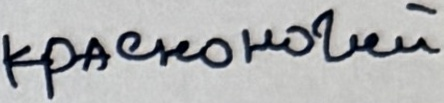красноногий
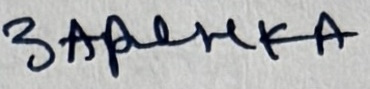зарянка
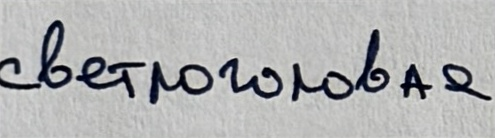светлоголовая
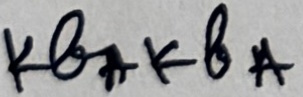кваква
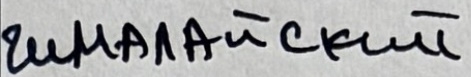гималайский
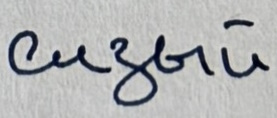сизый
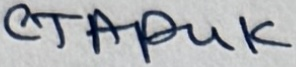старик
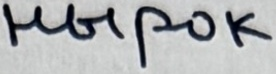нырок
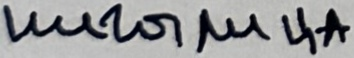пигалица
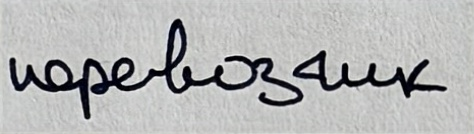поревозчик
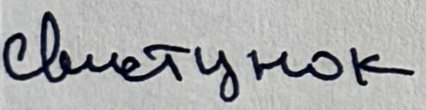свистунок
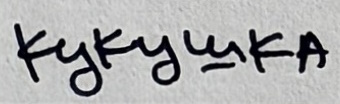кукушка
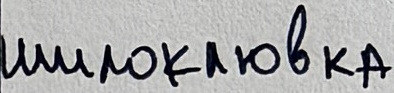шилоклювка
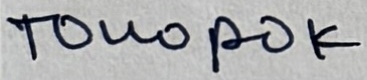топорок
